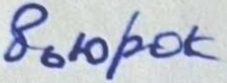вьюрок
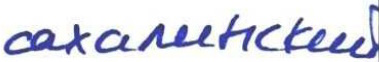сахалинский
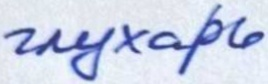глухарь
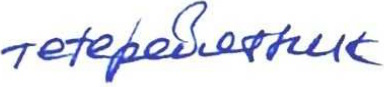тетеревятник
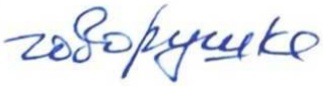говорушка
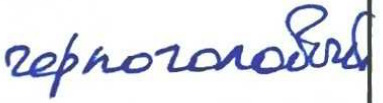черпоголовый
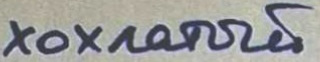хохлатый
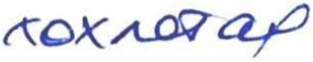хохлотая
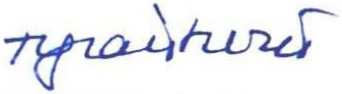тугайный
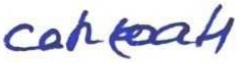сапсан
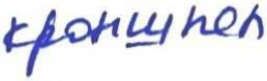кроншнеп
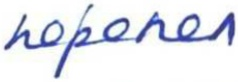порепел
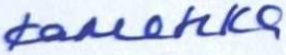каменка
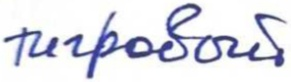тигровый
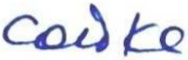сойка
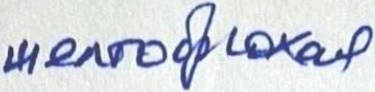желтобрюхая
